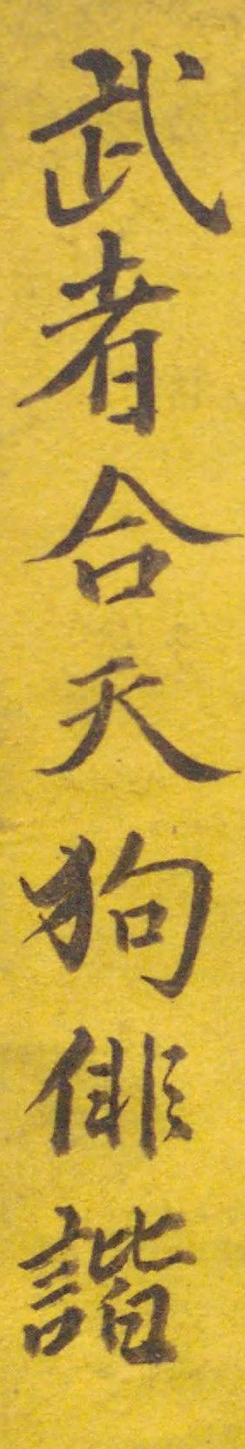武者合天狗俳諧

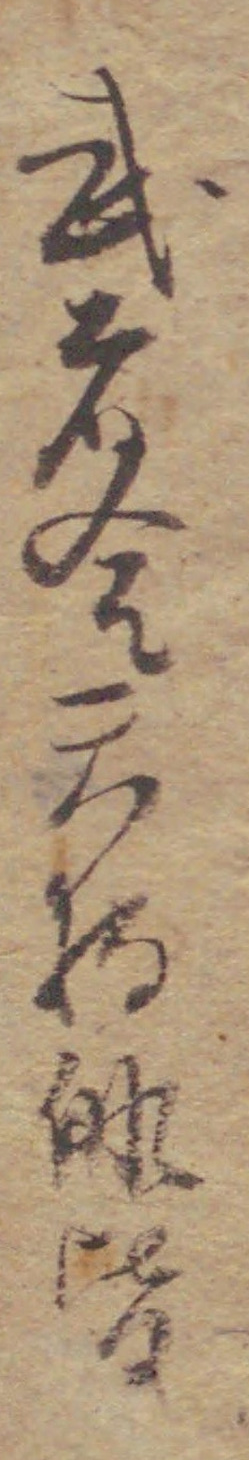武者合天狗俳皆

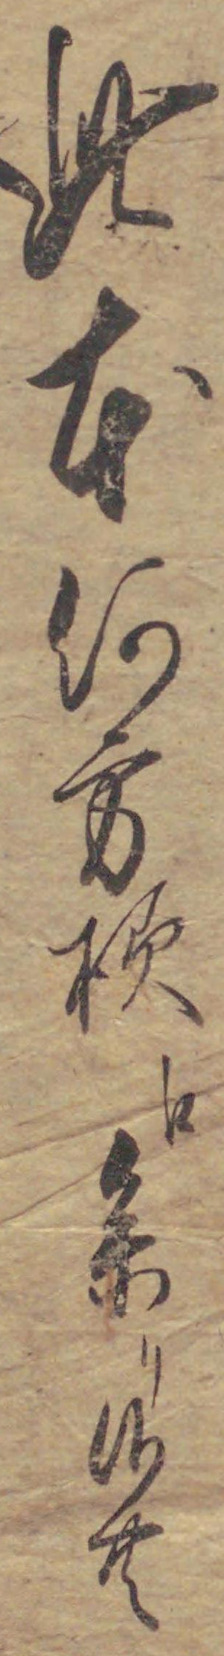此本何方様え参り候共
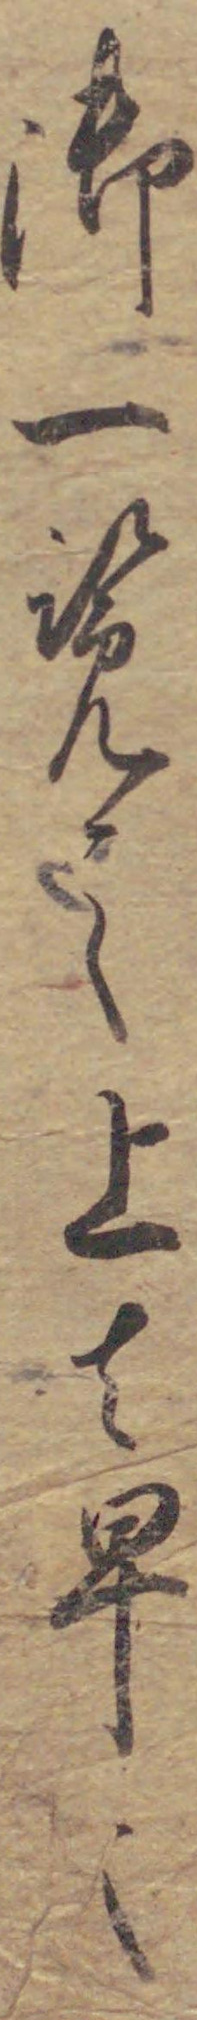御一覧之上て早々
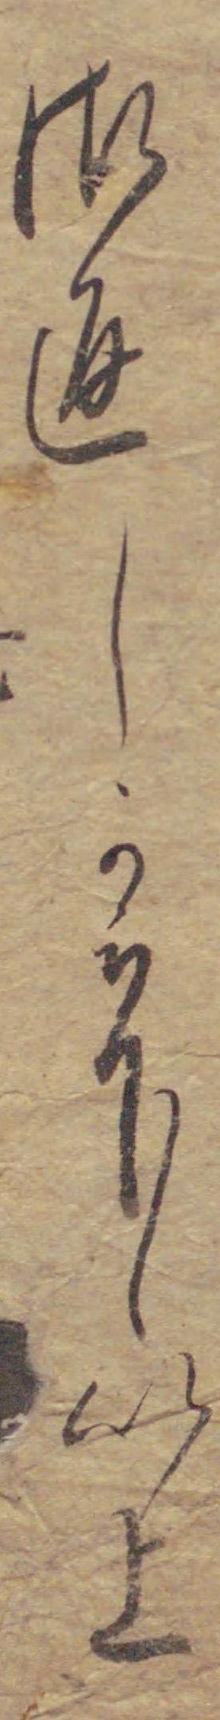御返し可被下候以上
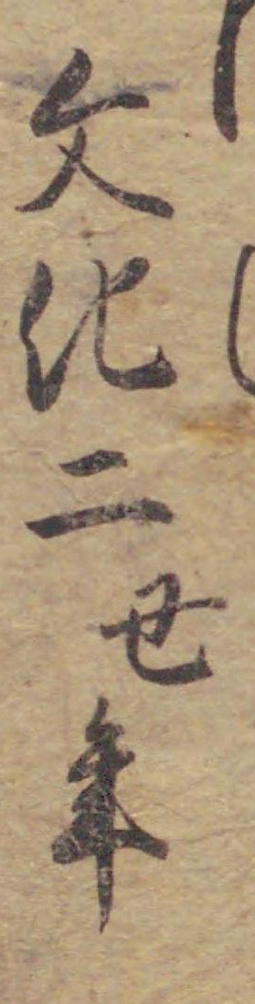文化二丑年

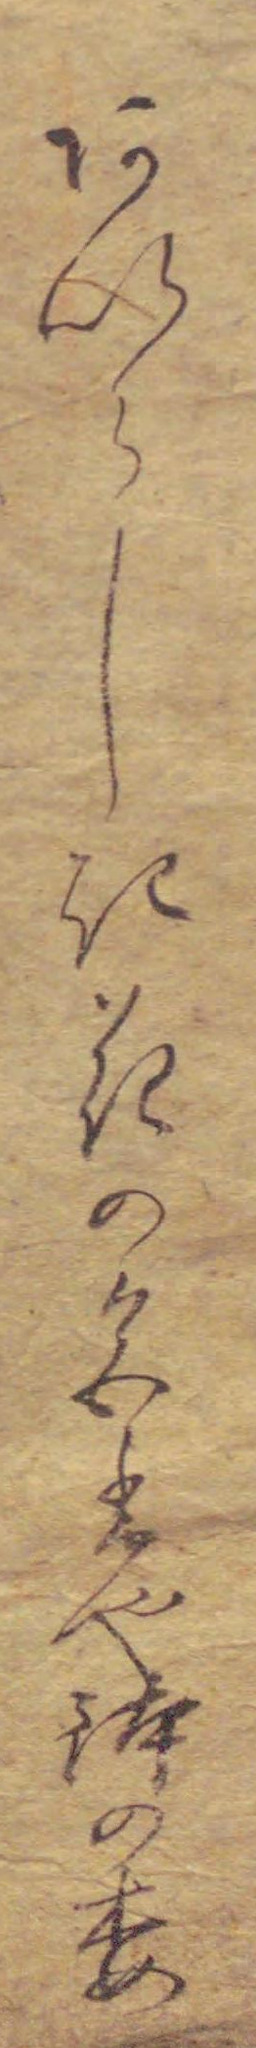あいらしき花の色香や鉢の梅
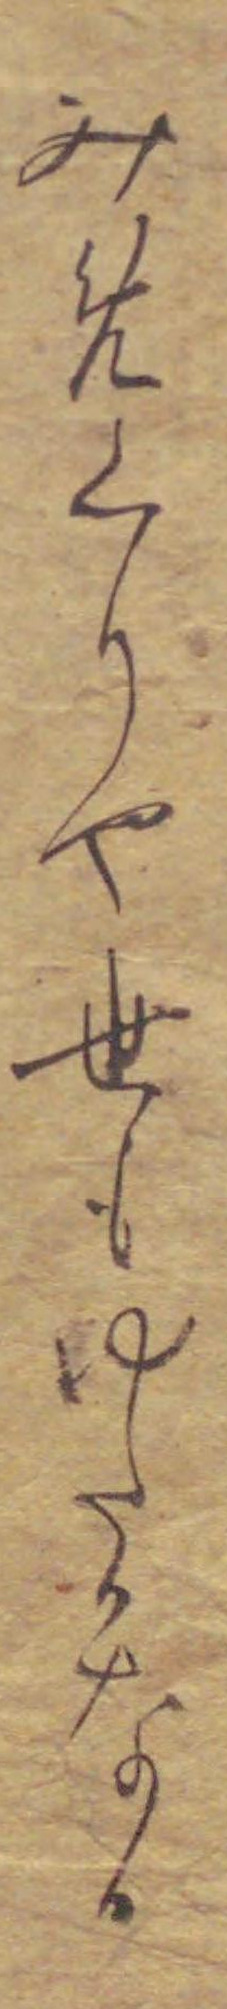みめくりや世もゆたかなる
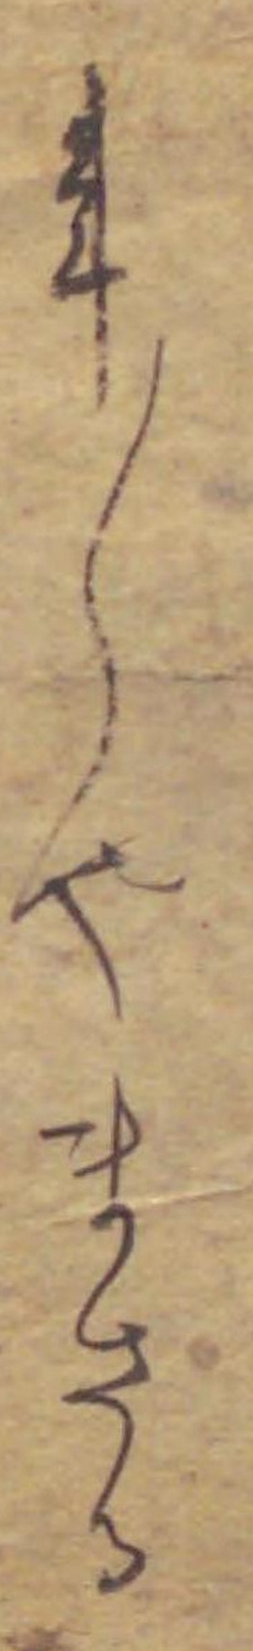年？〳〵やまさる
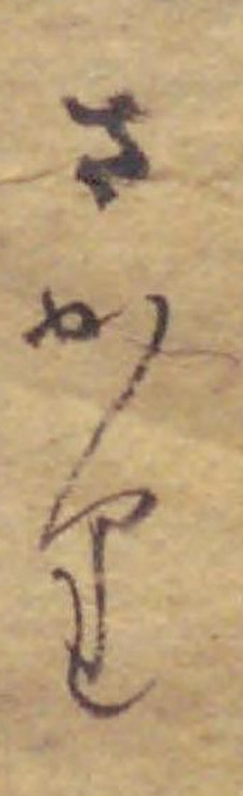さかり
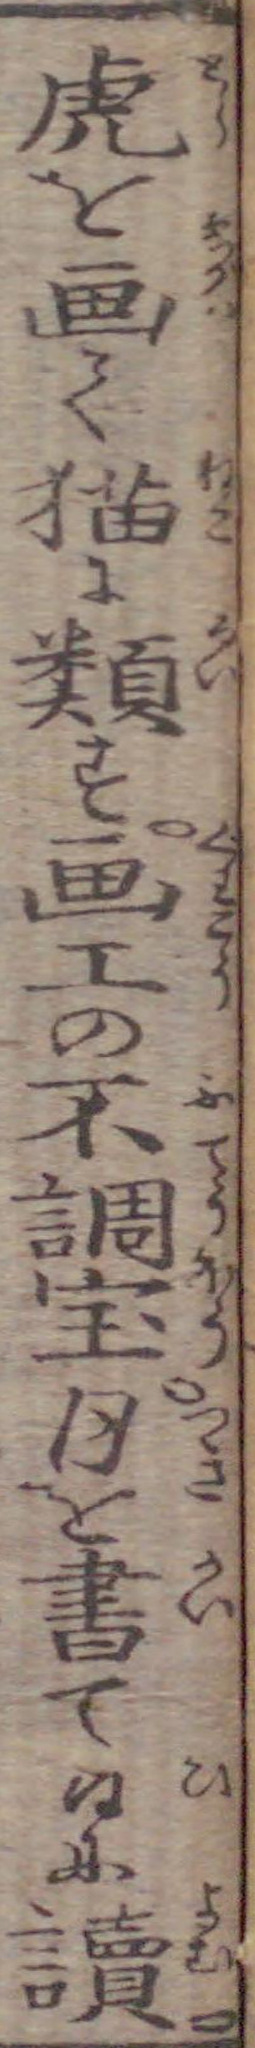虎を画て猫に類す。画工の不調宝。月を書て日に読。
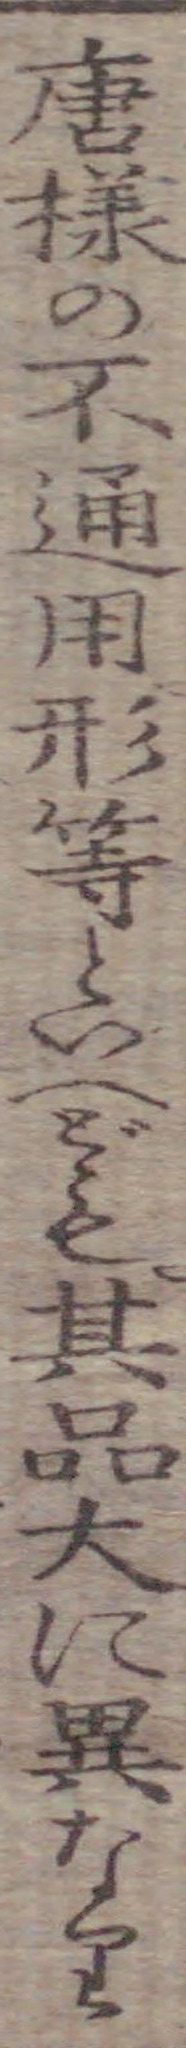唐様の不通用形等といへども。其品大に異なり
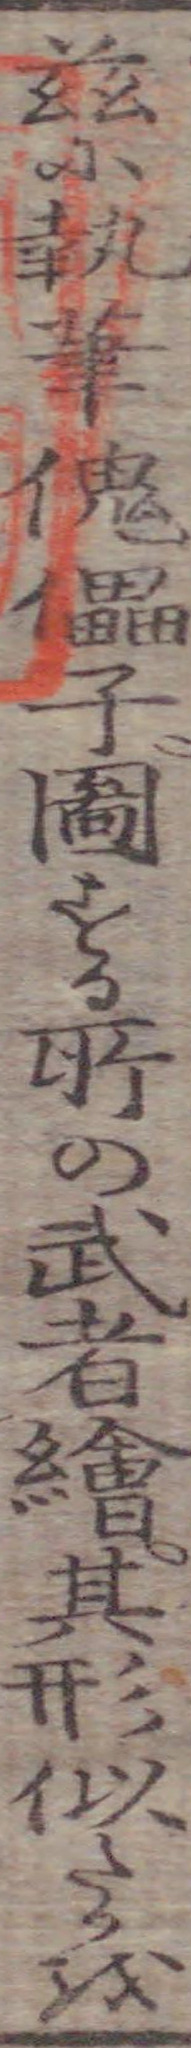茲に執筆傀儡子。図する所の武者絵。其形似たるを
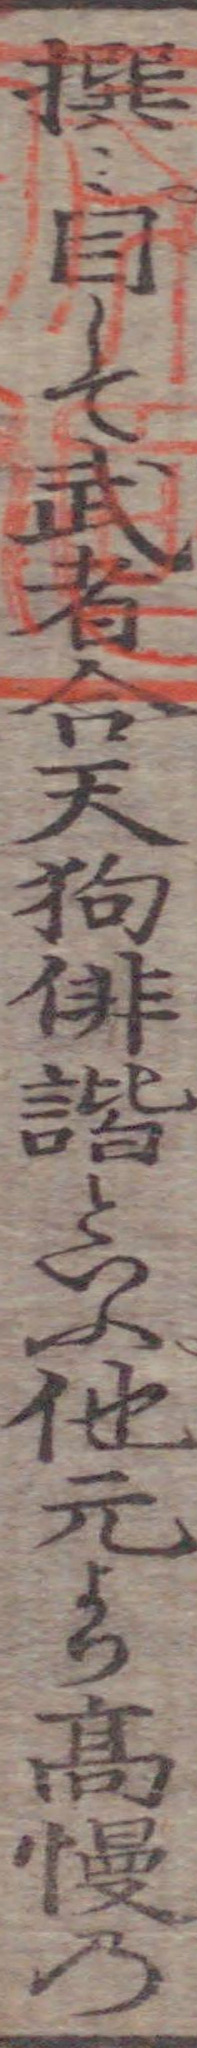撰み。目して武者合天狗俳諧といふ。他元より高慢の
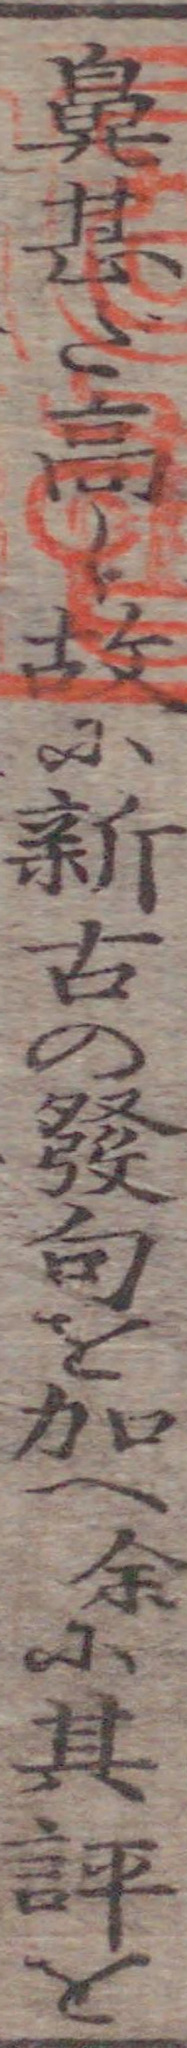鼻甚だ高し。故に新古の発句を加へ。余に其評を
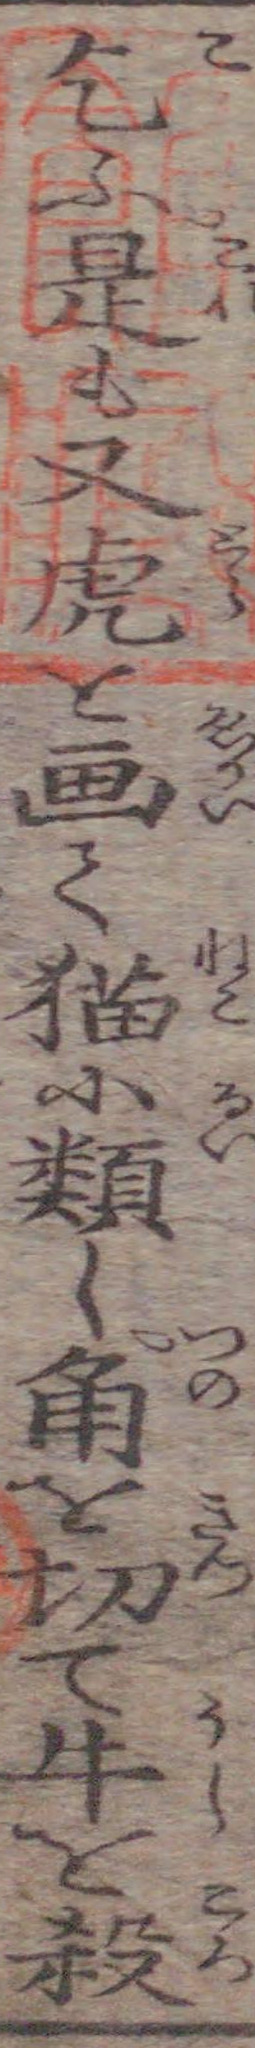乞ふ是も又虎を画て猫に類し。角を切て牛を殺
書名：武者合天狗俳諧 : 2巻
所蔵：国立国会図書館 National Diet Library, JAPAN
